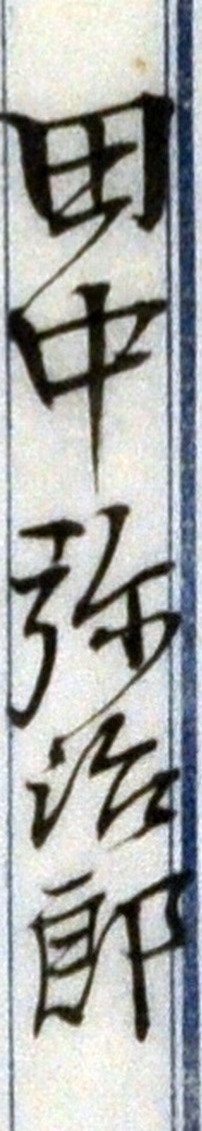田中弥次郎
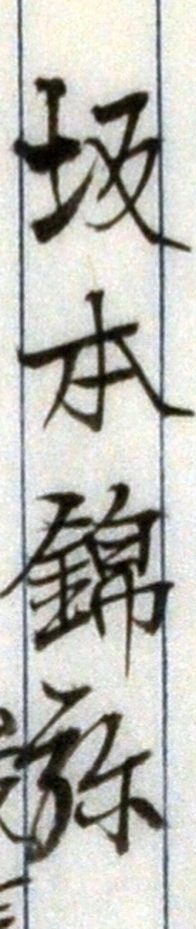坂本錦弥
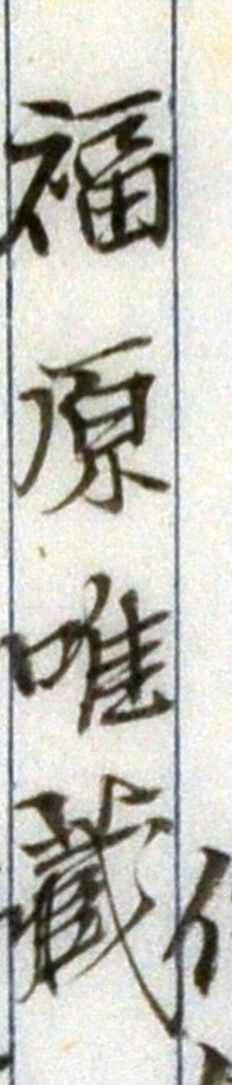福原唯蔵
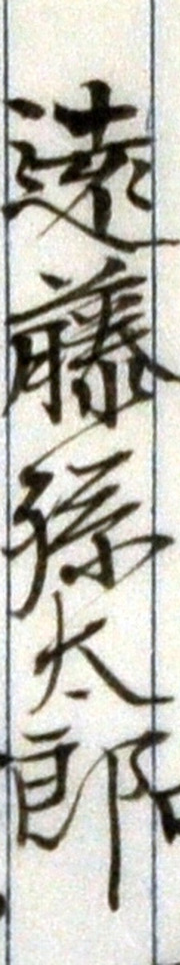遠藤孫太郎
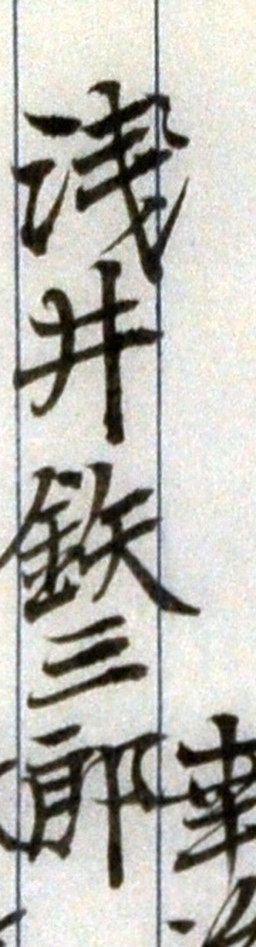浅井鉄三郎

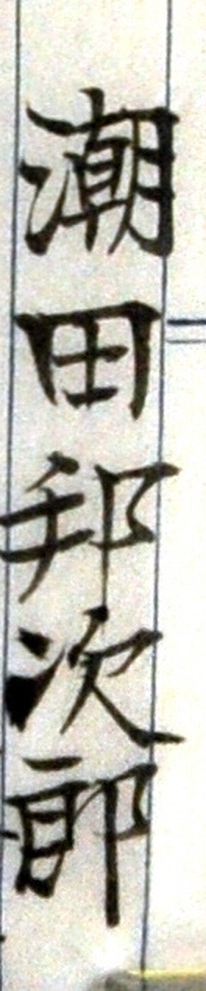潮田邦次郎
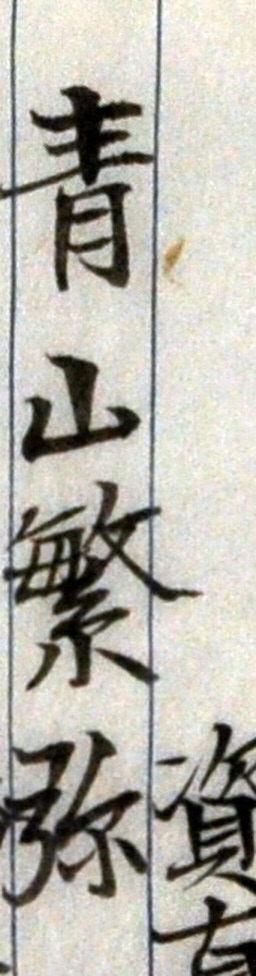青山繁弥
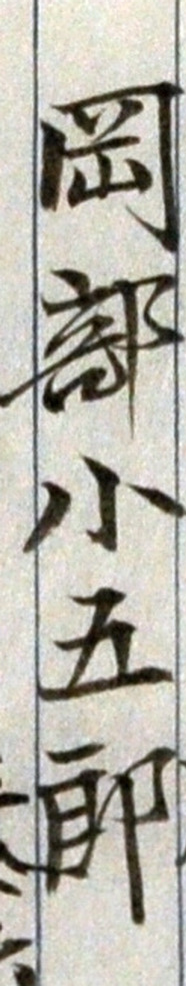岡部小五郎
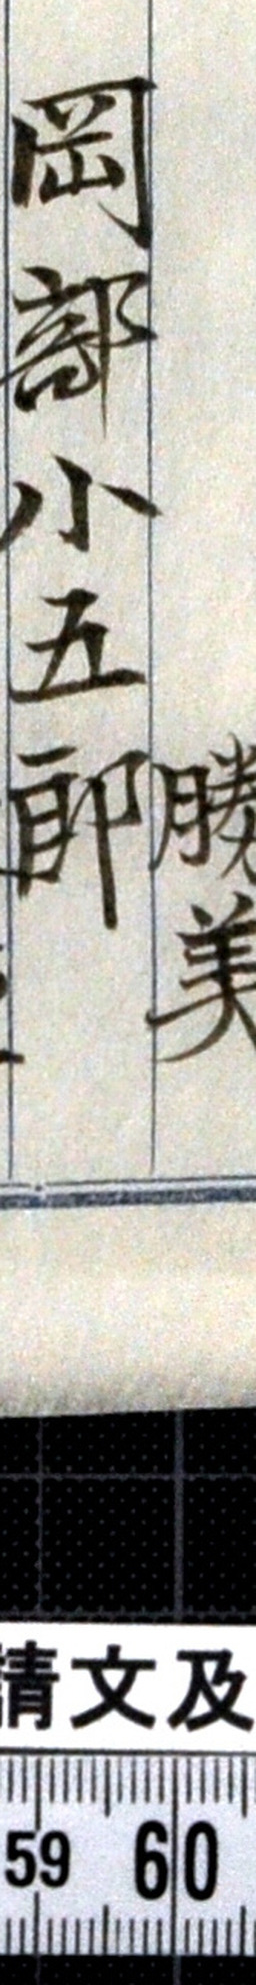岡部小五郎
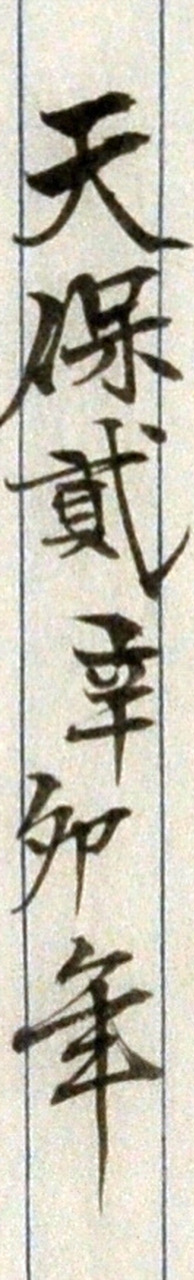天保貮辛卯年
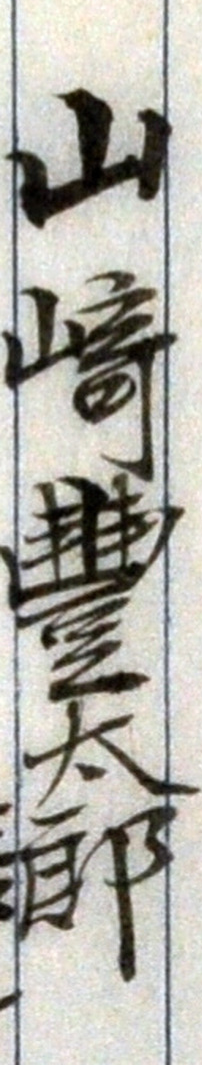山崎豊太郎
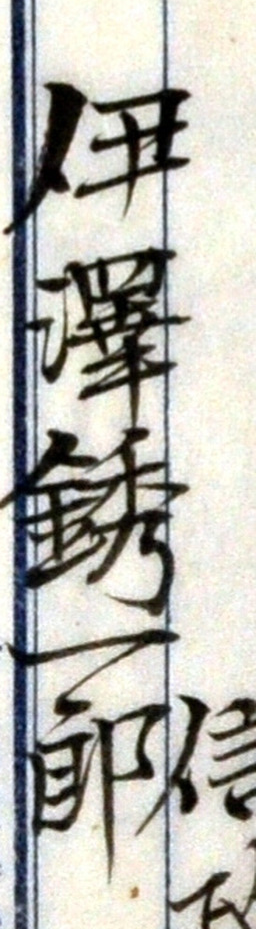伊沢銹一郎
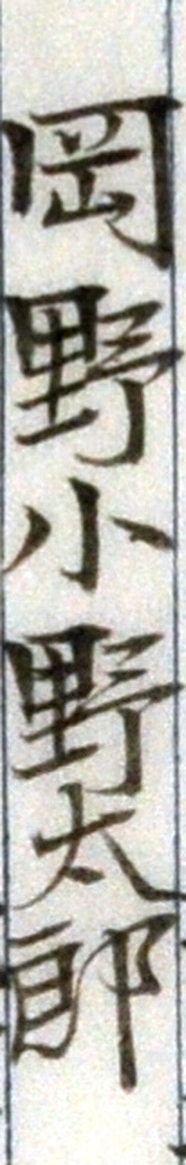岡野小野太郎
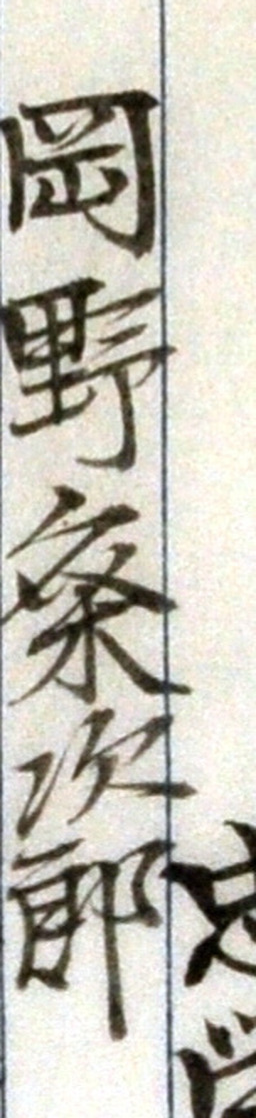岡野粂次郎
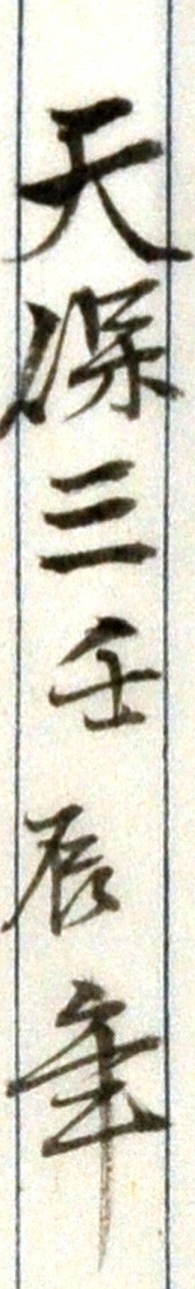天保三壬辰年
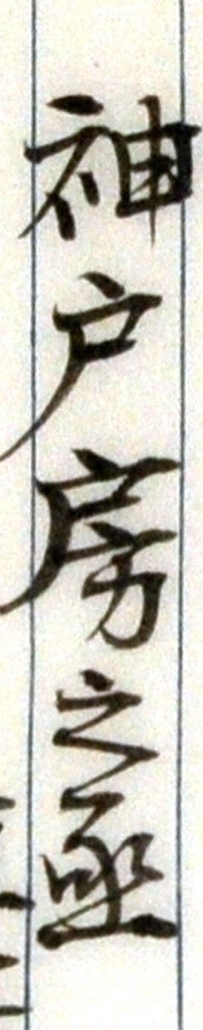神戸房之丞
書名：竹内流・甲州流・荒木流・一刀流新当流起請文及免許写堤宝山流手鏡及個之大事
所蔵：伊那市立高遠町図書館・合同会社AMANE
